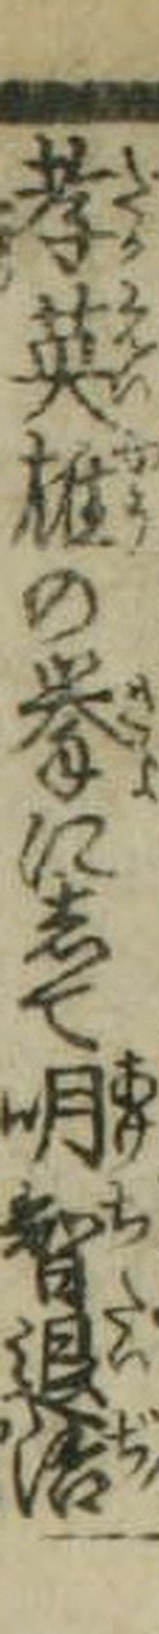孝英雄の挙にして明智退治
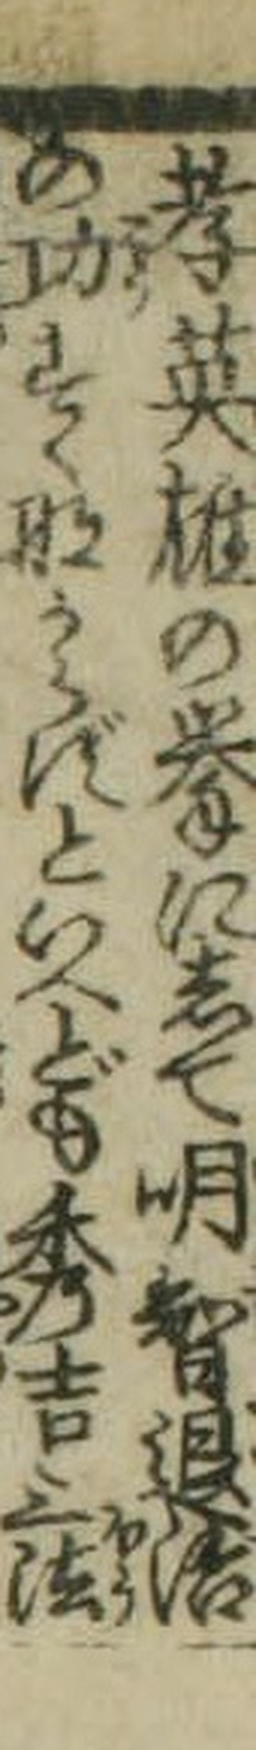の功すくなからずといへども秀吉三法
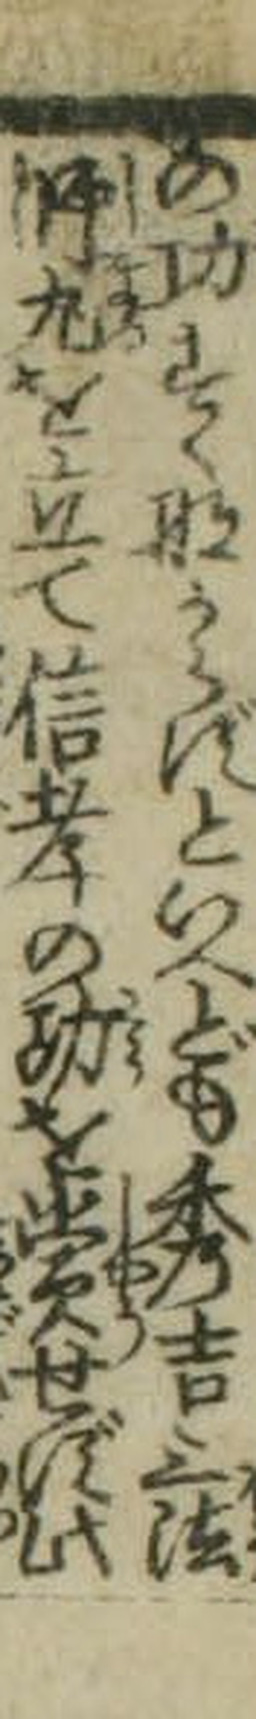師丸を立て信孝の功を賞せず此
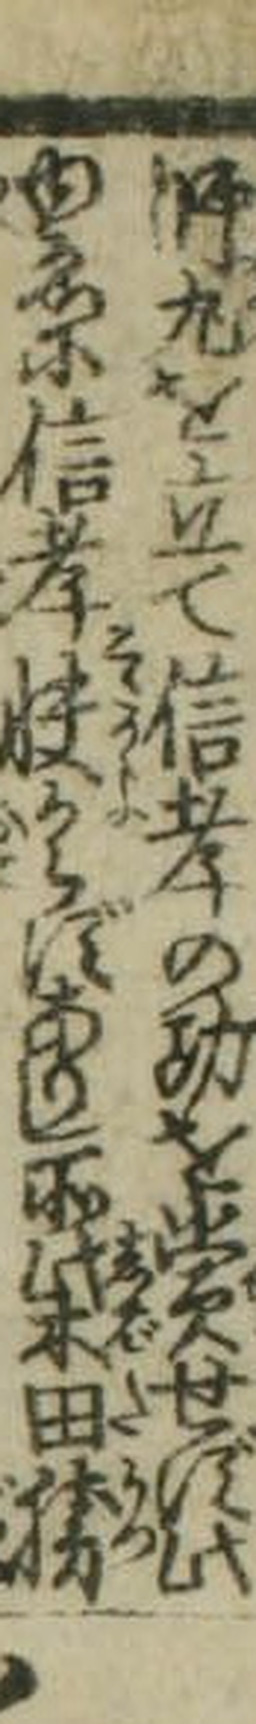ゆゑに信孝快からずありし所柴田勝
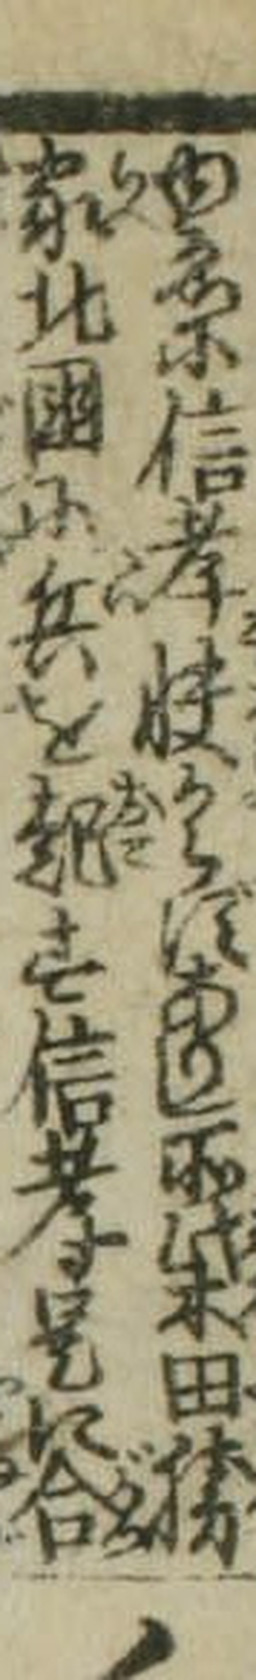家北国に兵を起す信孝是に合
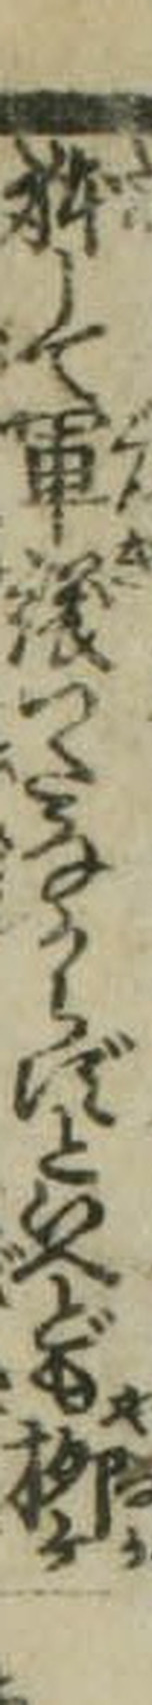体して軍議つたなからずといへども柳ヶ
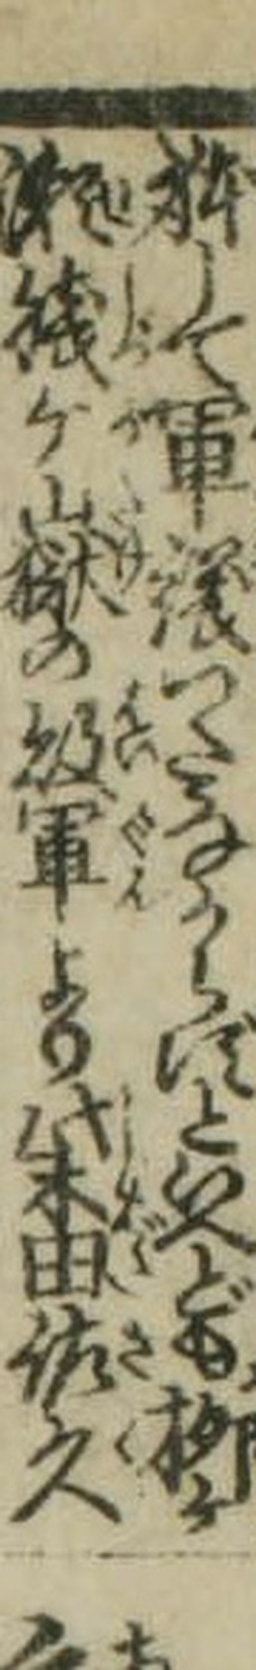瀬賤ヶ嶽の敗軍より柴田佐久
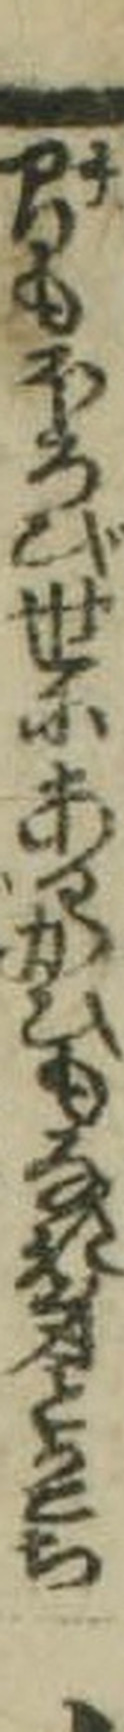間もほろび世にあるかひもなき身とかこち
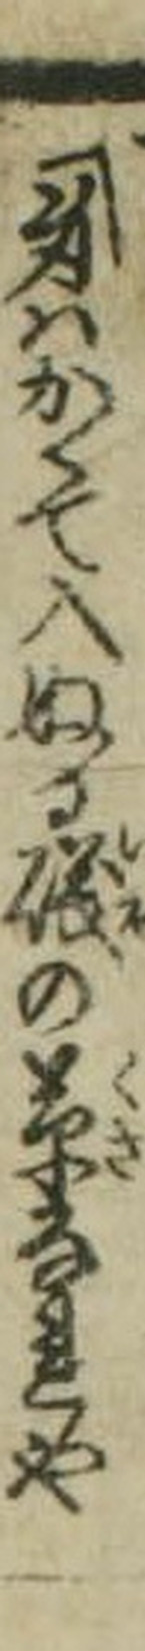〽身はかくて入ぬる磯の草なれや
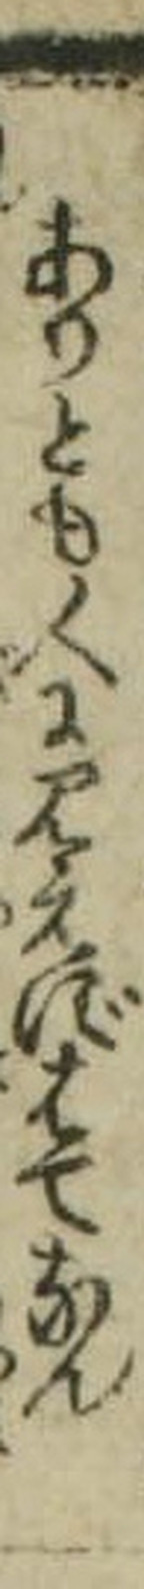ありとも人に見えずはてなん
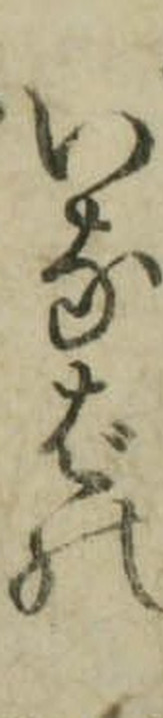いなばの
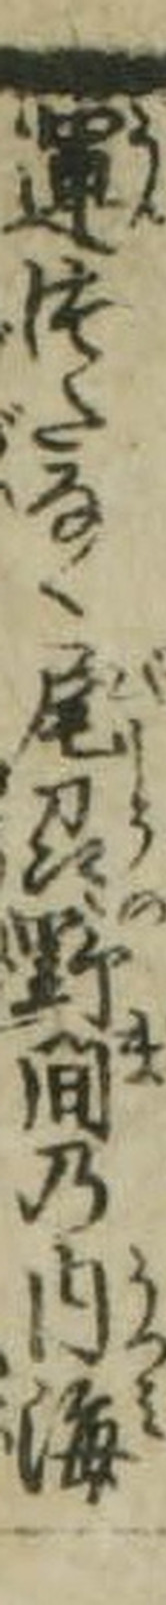運つたなく尾州野間の内海
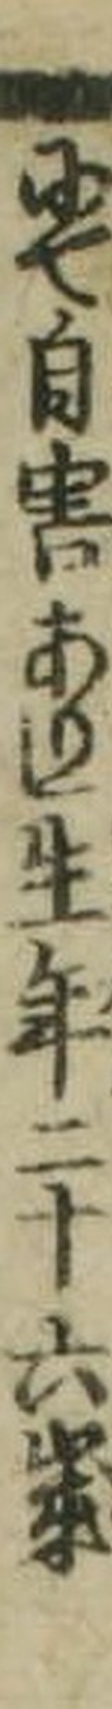にて自害ありし生年二十六歳
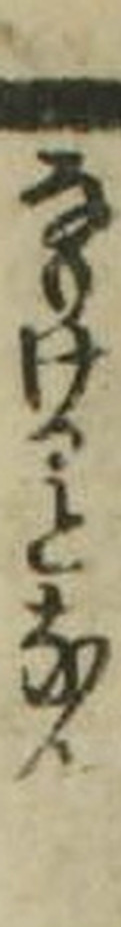なりけるとなん
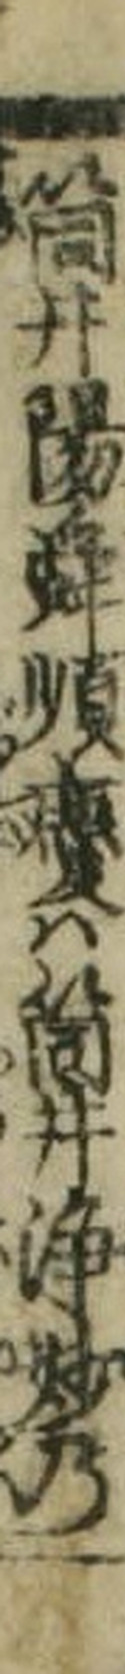筒井陽舜順慶は筒井浄妙の
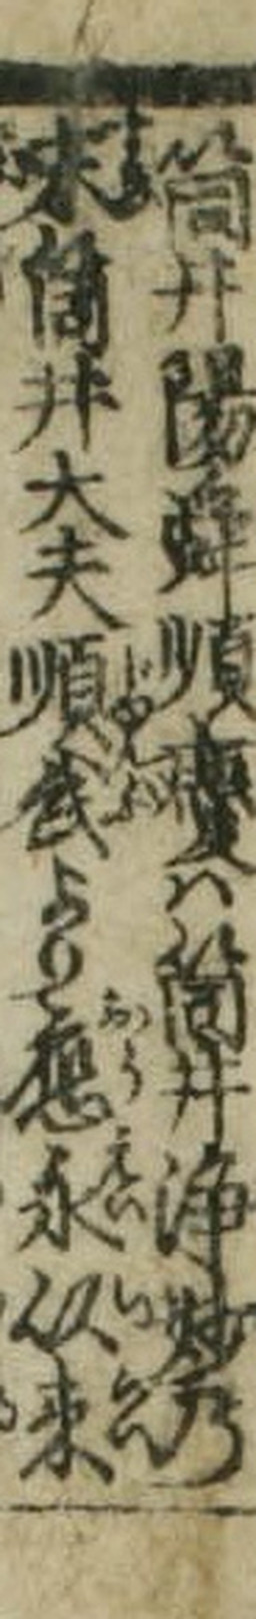末筒井大夫順武より応永以来
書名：續英雄百人一首
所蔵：東京学芸大学附属図書館
